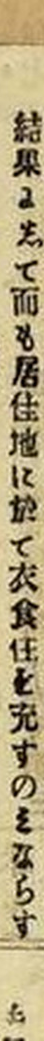結果にして而も居住地に於て衣食住を充すのみならす
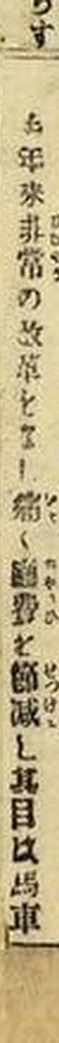去年来非常の改革をなし痛く庁費を節減し其目は馬車
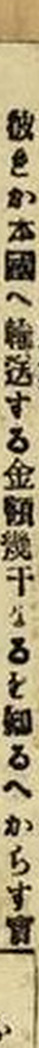彼れか本国へ輸送する金額幾千なるを知るへからす実
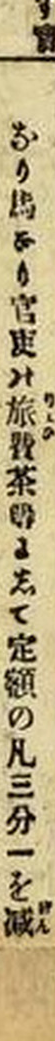なり馬なり官吏の旅費茶等にして定額の凡三分一を減
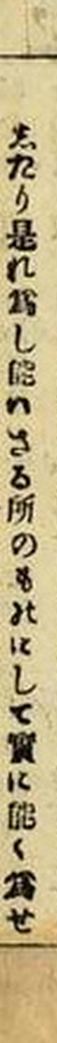したり是れ為し能はさる所のものにして実に能く為せ
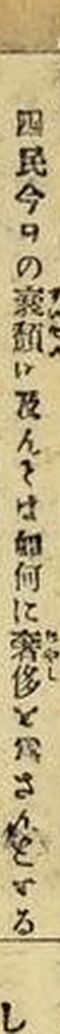四民今日の衰頽に及んては如何に奢侈を為さんとする
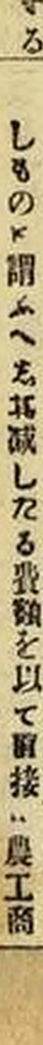しものと謂ふへし其減したる費額を以て直接は農工商
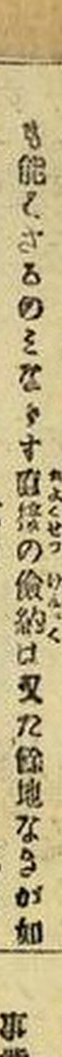も能はざるのみならす直接の倹約は又た余地なきが如
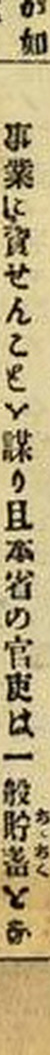事業に資せんことを謀り且本省の官吏は一般貯蓄をな
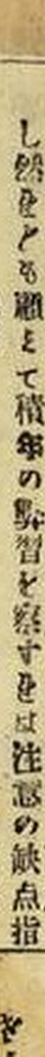し然れとも顧みて積年の弊習を察すれは注意の欠点指
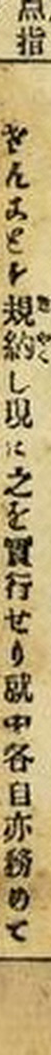さんことを規約し現に之を実行せり就中各自亦務めて
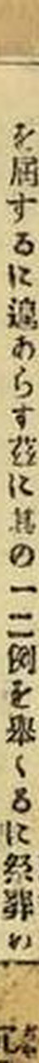を屈するに遑あらす茲に其の一二例を挙くるに祭葬の
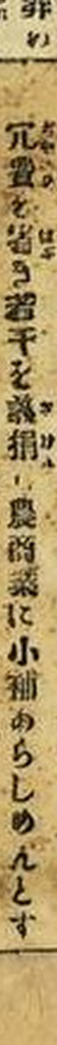冗費を省き若干を義捐農商業に小補あらしめんとす
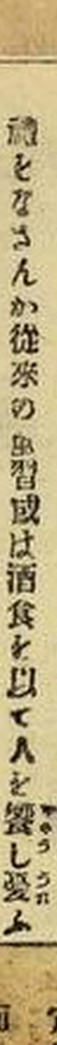礼をなさんか従来の風習或は酒食を以て人を饗し憂ふ
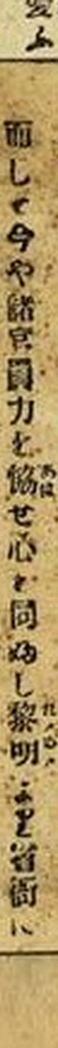而して今や諸官員力を協せ心を同ふし黎明より省衙に
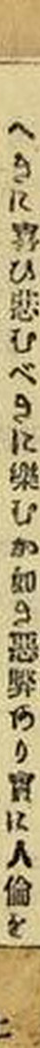へきに喜ひ悲むべきに楽むか如き悪弊あり実に人倫を
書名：温古集 五巻
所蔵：福井県文書館 Fukui Prefectural Archives
